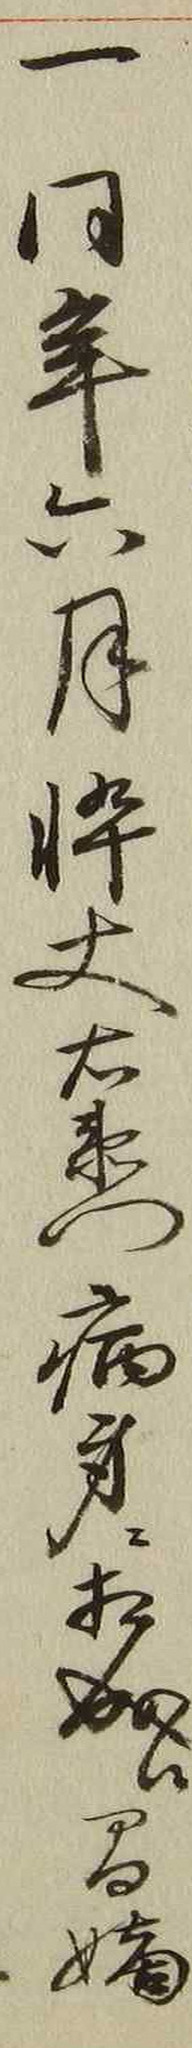一同年六月忰尉丈右衛門病身ニ相成候間嫡
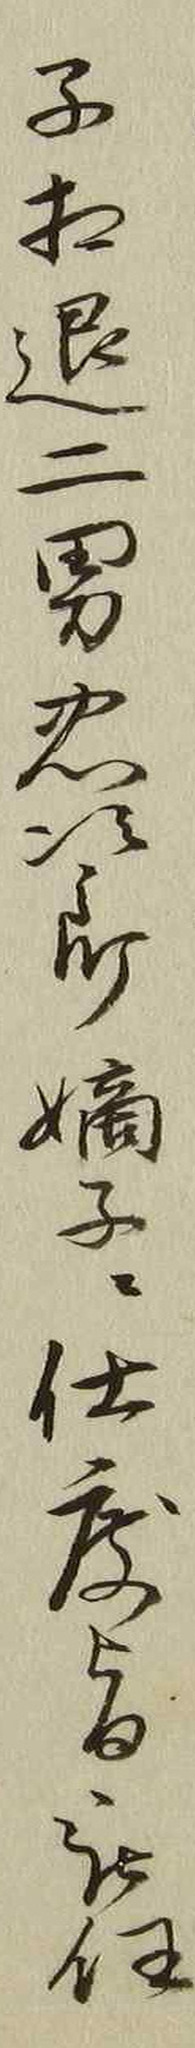子相退二男忠次郎嫡子ニ仕度旨被伺
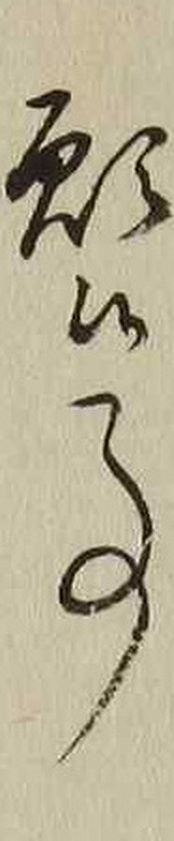願候事
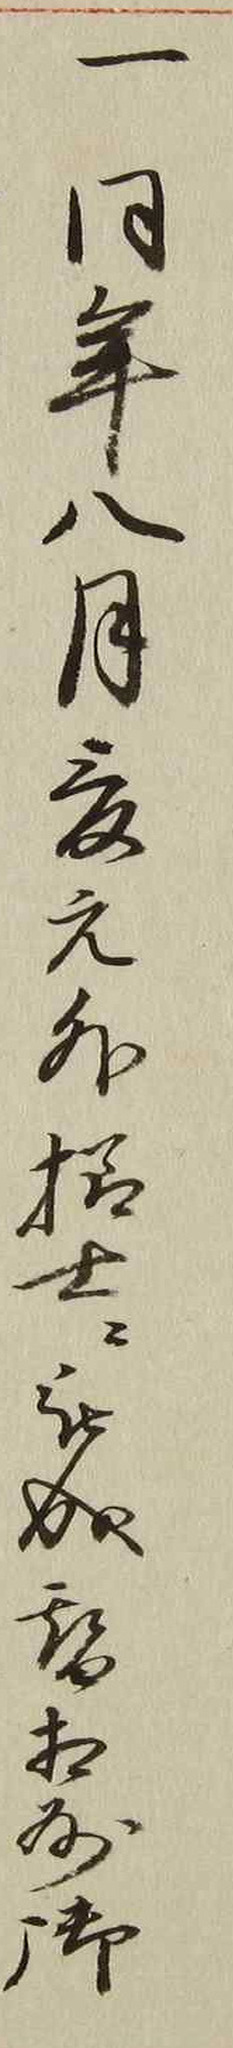一同年八月爰元外様士ニ被成替相州御
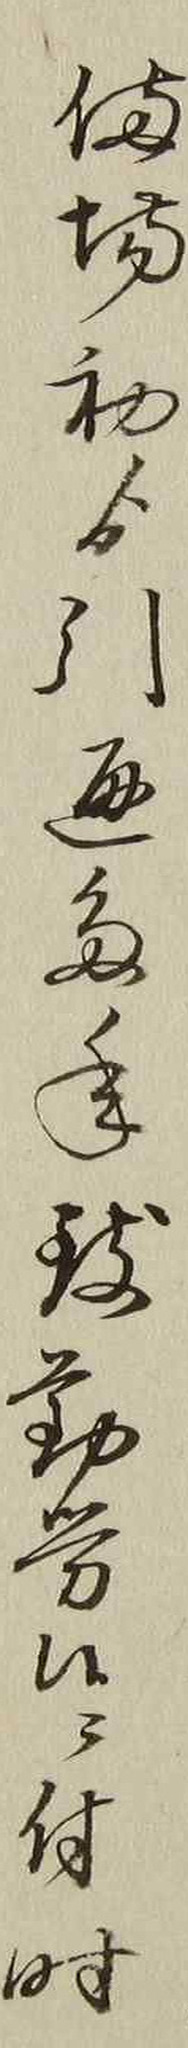備場初ゟ引通多年致勤労候ニ付時
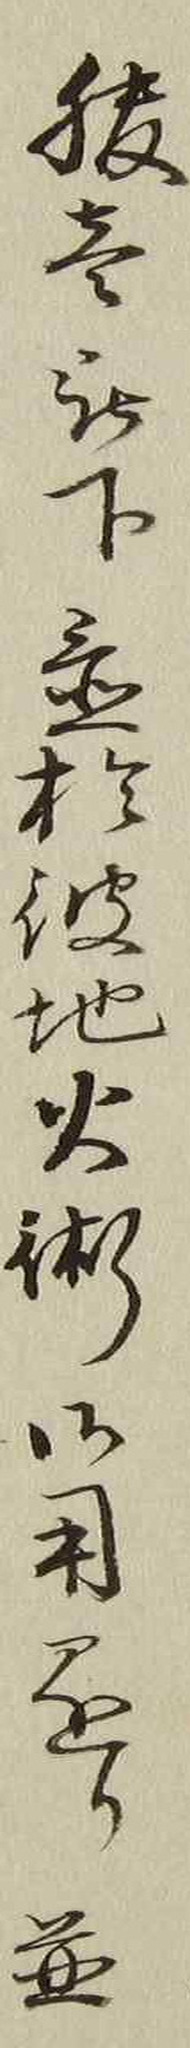服壱被下置於彼地火術御用懸り並
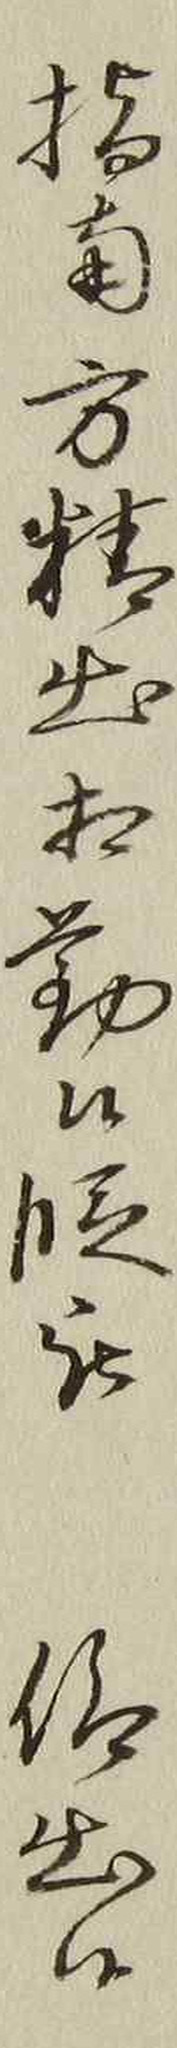指南方精出相勤候段被仰出候
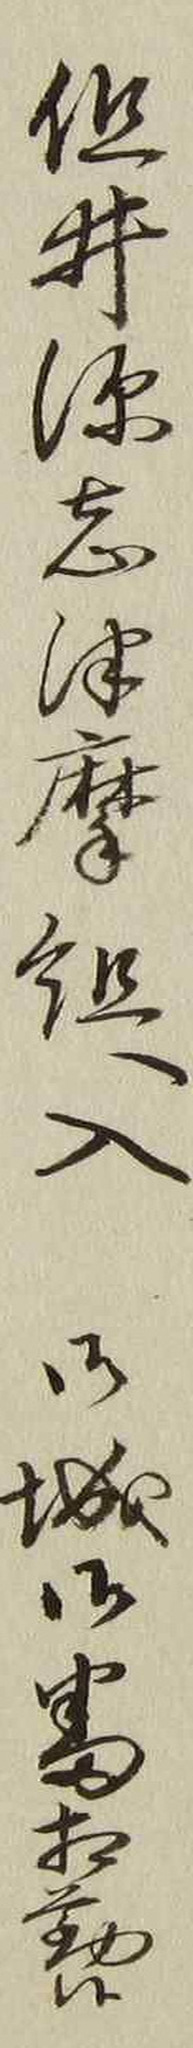但井沢志津摩組ヘ入御城御番相勤候
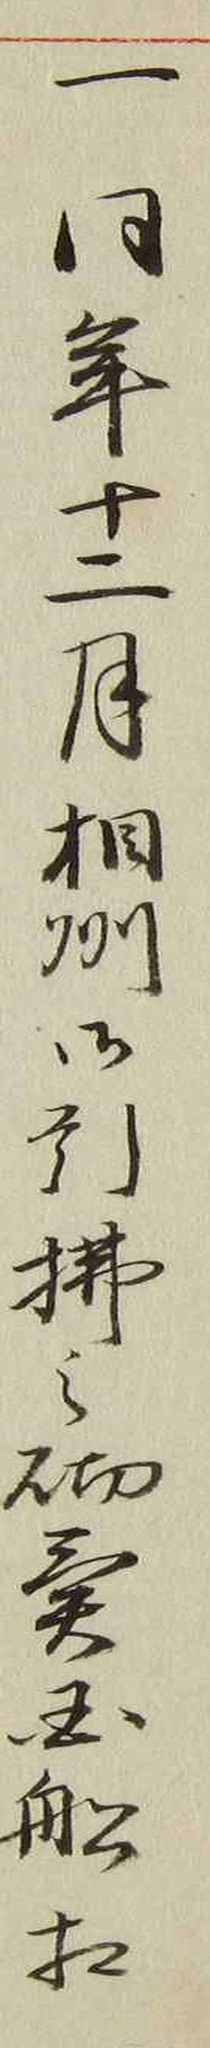一同年十二月相州御引払之砌異国舩相
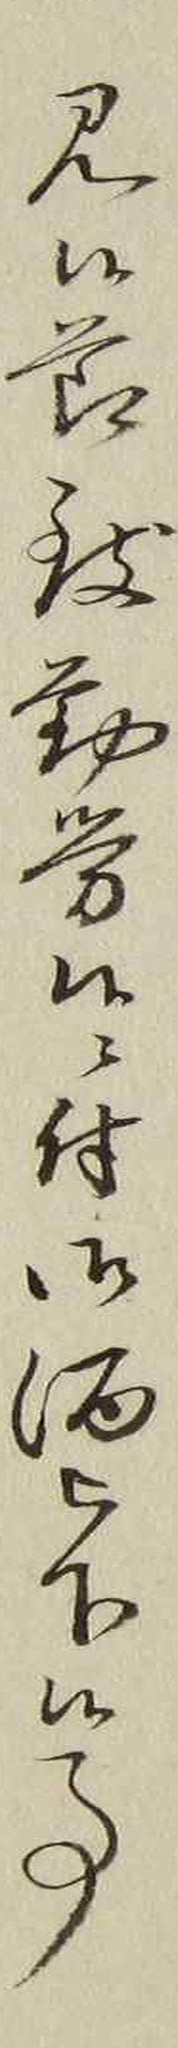見候節致勤労候ニ付御酒被下候事
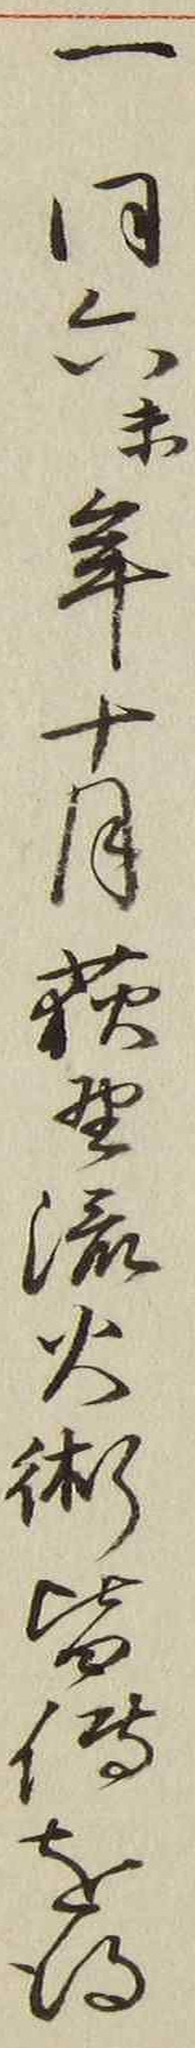一同六未年十月荻野流火術皆伝を得
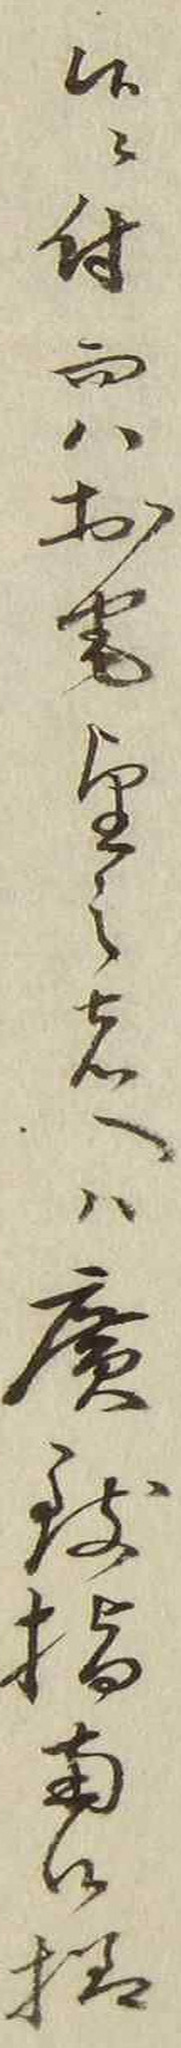候ニ付而ハお宅望之者へハ広致南候

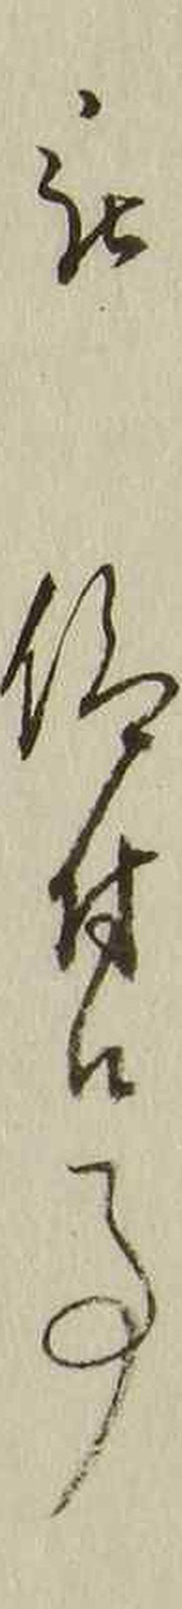被仰付候事
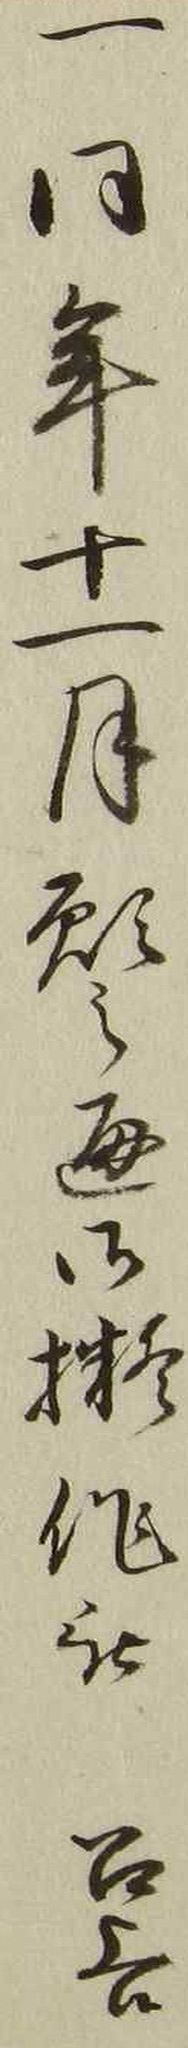一同年十一月願之通御擬作被召上候
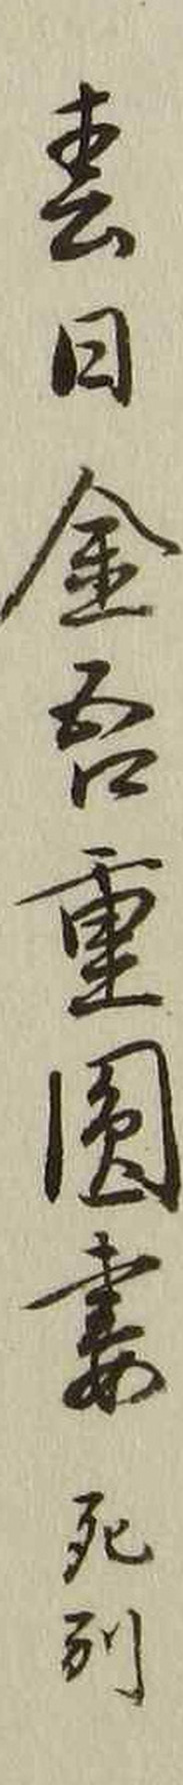女春日金吾重圓妻死別
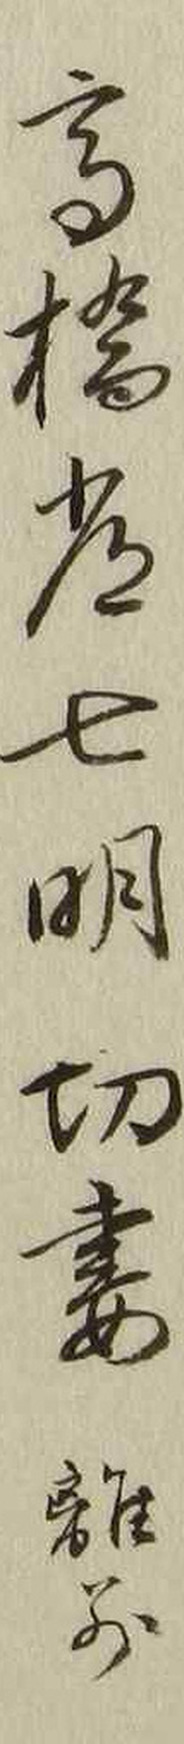高橋常七明功妻離別
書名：諸士系譜　巻之114　か之部22
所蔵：会津若松市立会津図書館
